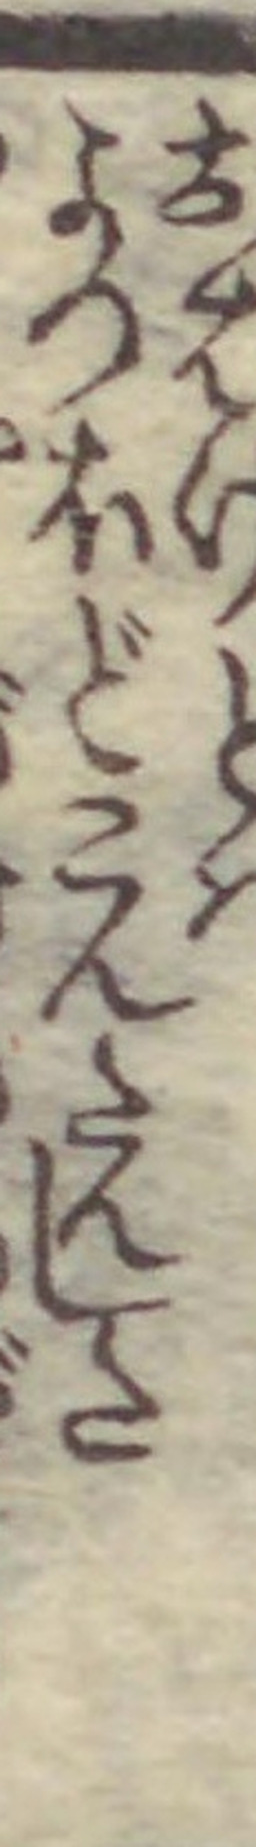よつほどこんたんした
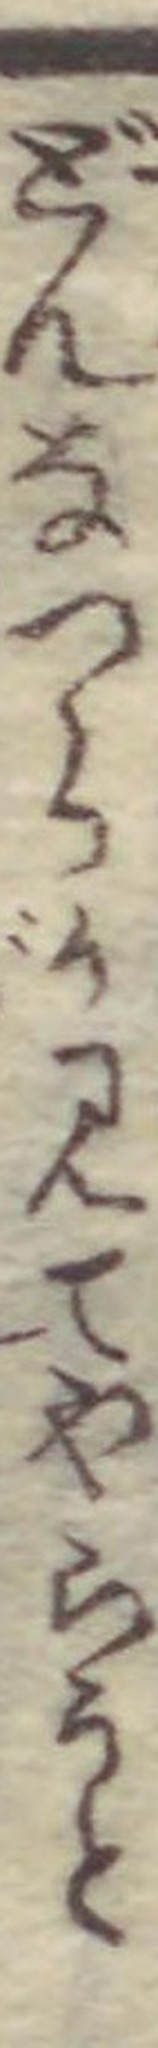どんなつらか見てやらうと
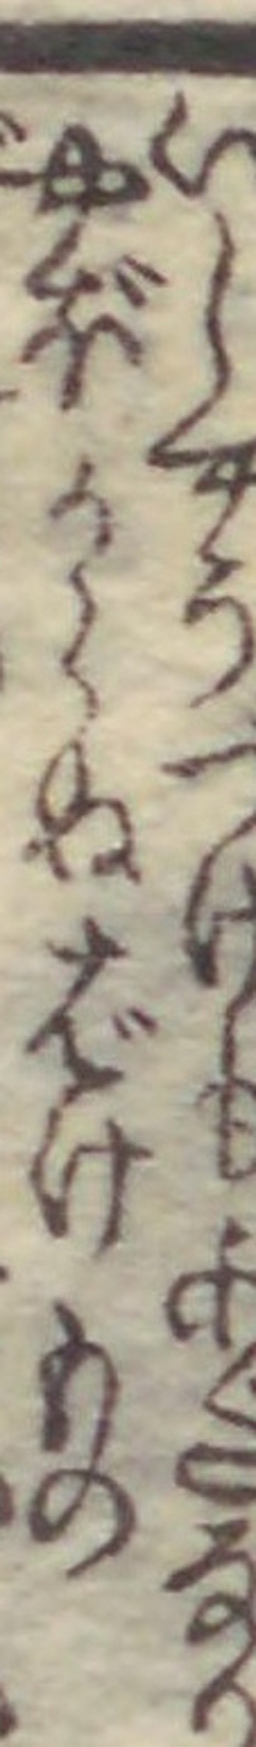やぼからぬばけもの
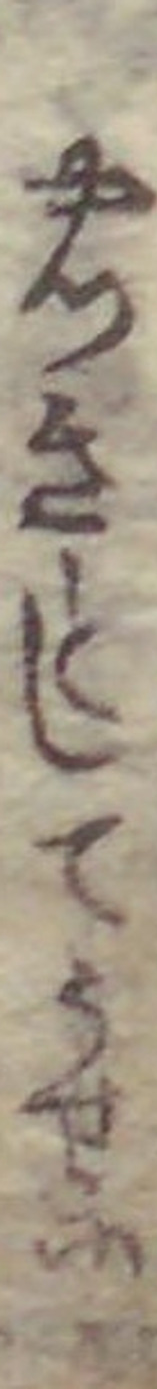やつきとしてうせに
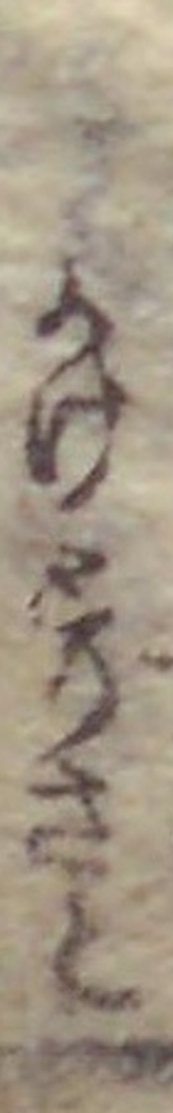かけとりさと
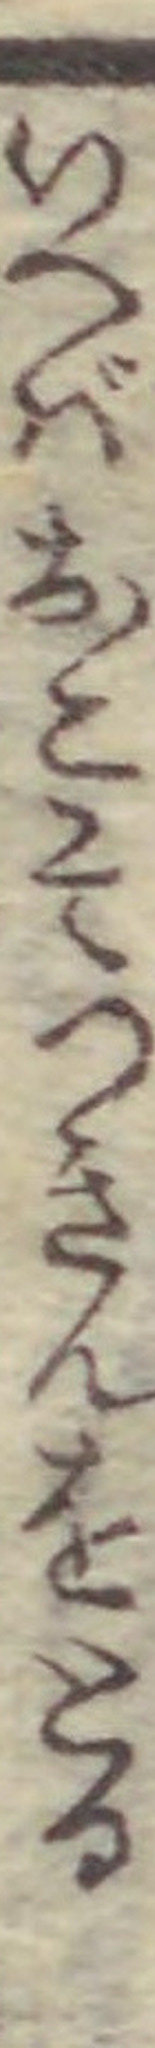いへばおこそづきんをとる
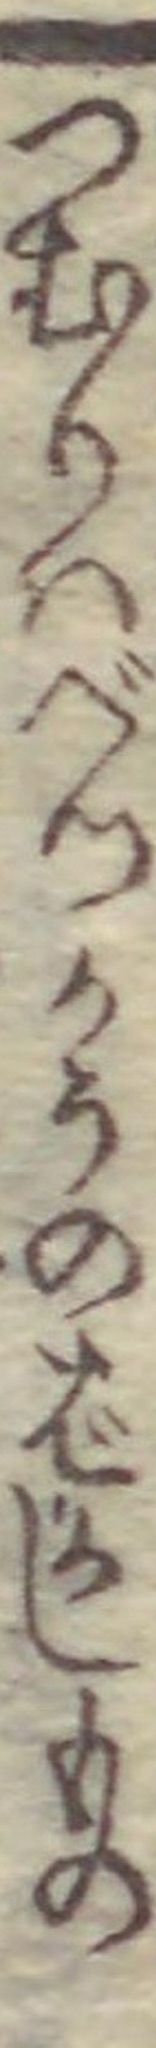つむりはべつかうのばかしもの
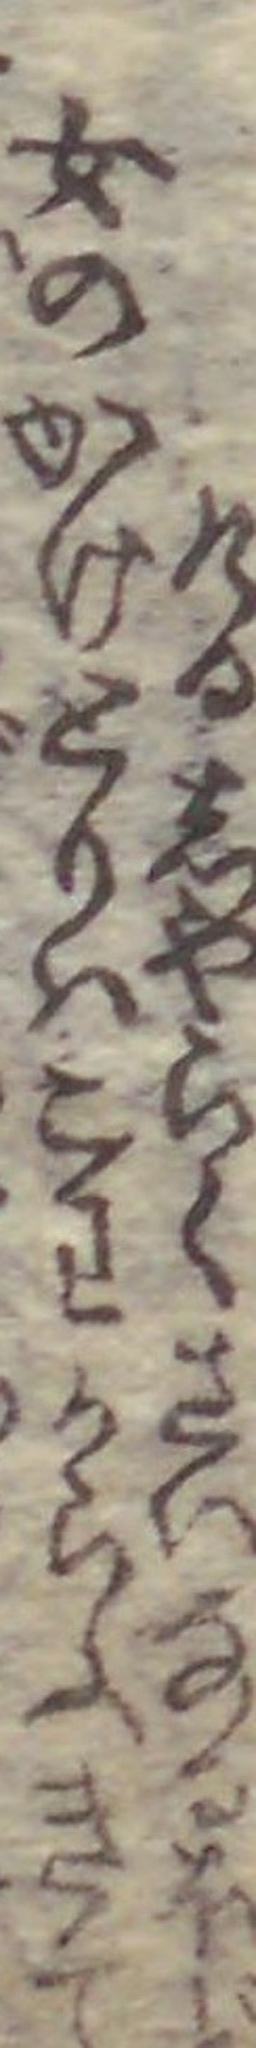女のかけとりはこわからふきて
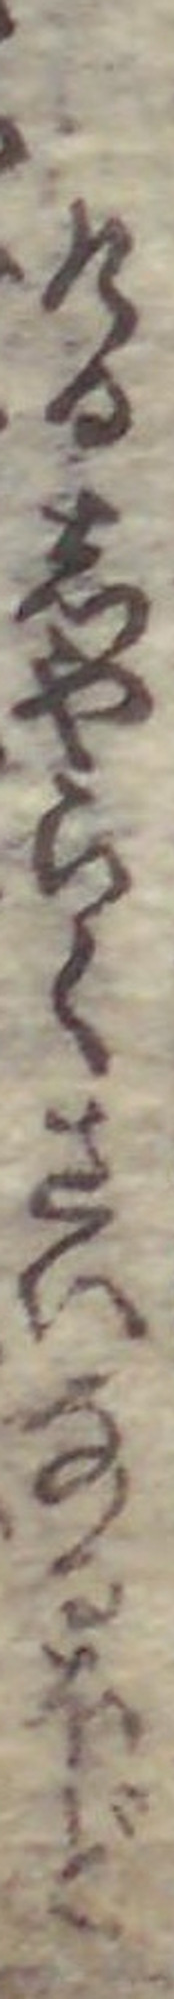けるしやらくさいなるほど
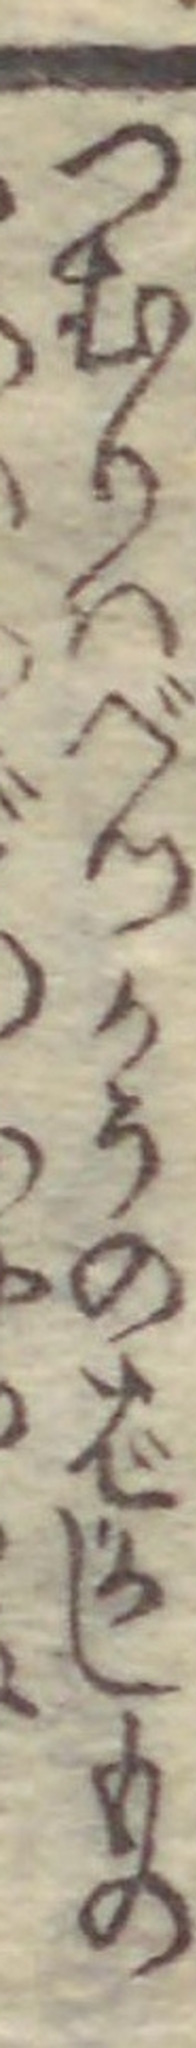つむりはべつかうのばかしもの
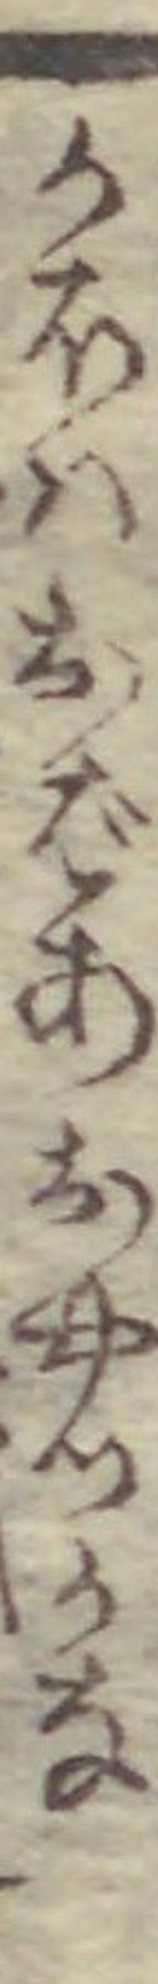かほはおばあおやつかな
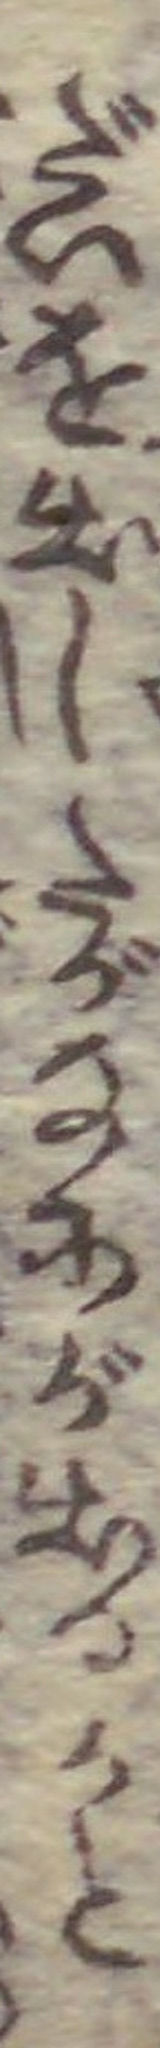だいを出したがなにが出るかと
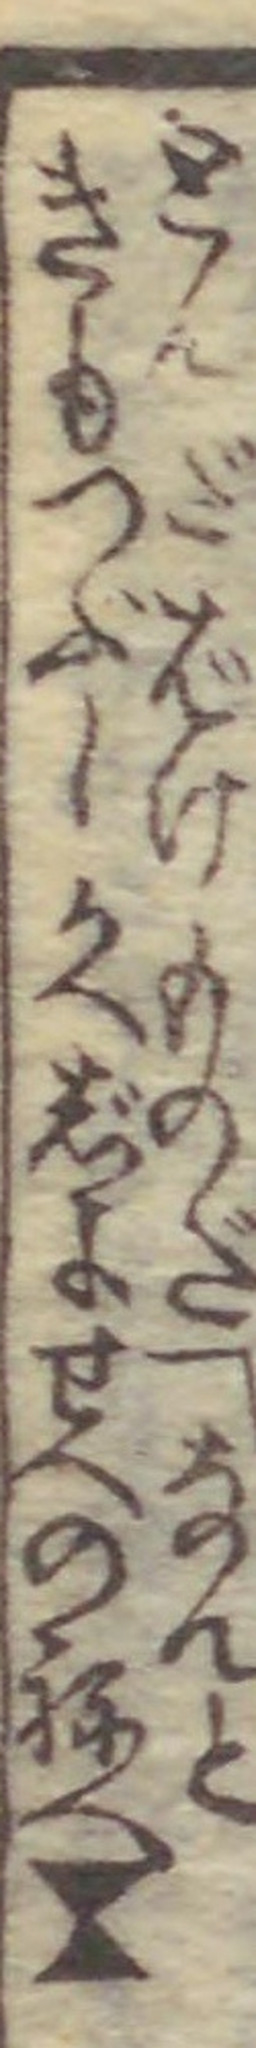きもつぶしかへじよせへのねへ▼▲
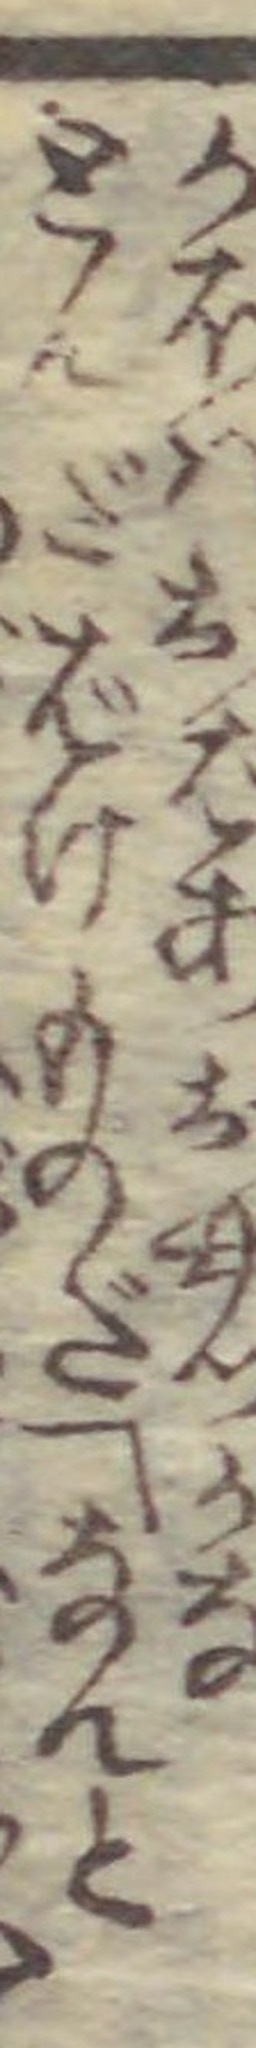とんだばけものだ〽なんと
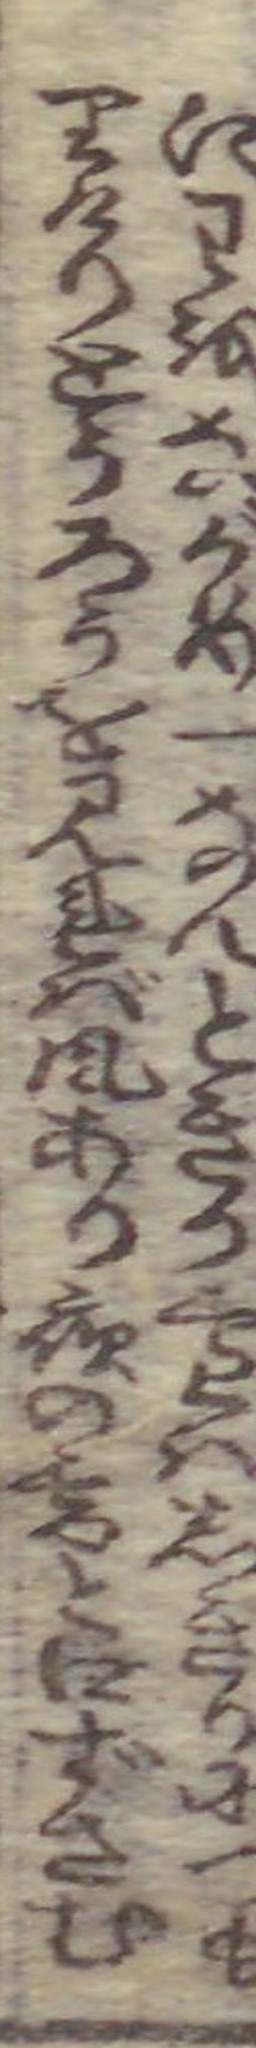りけりとうろうを見れば風あり夜の雪と口ずさむ
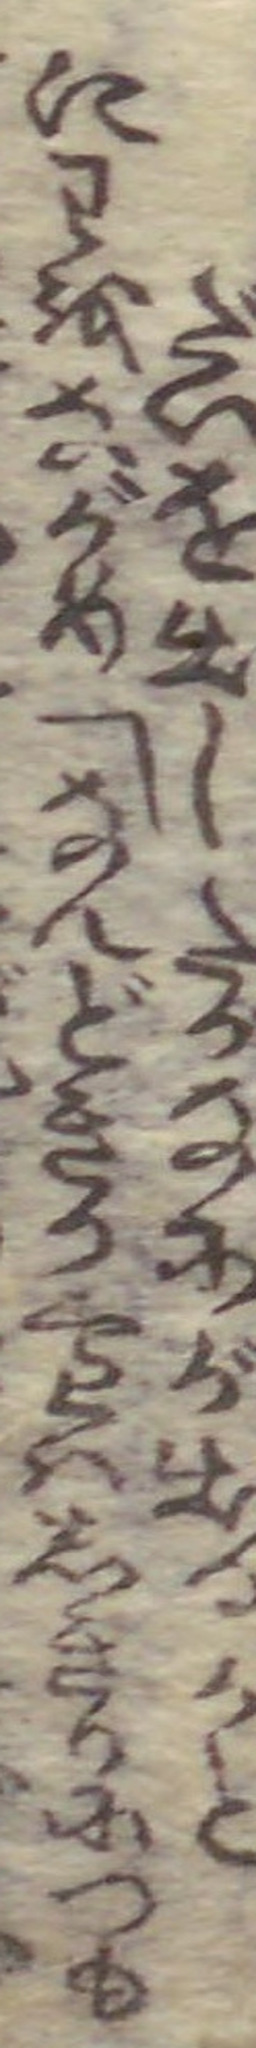にわをながめ〽なんどきか雪はしきりにつも
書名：大時代唐土化物 3巻. 曽我太夫染
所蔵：国立国会図書館 National Diet Library, JAPAN
